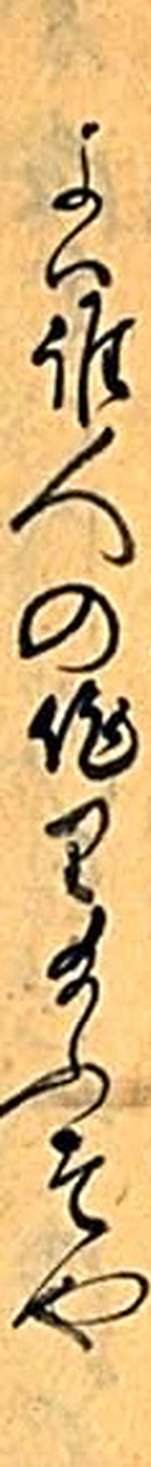よは誰人の作り給ふそや
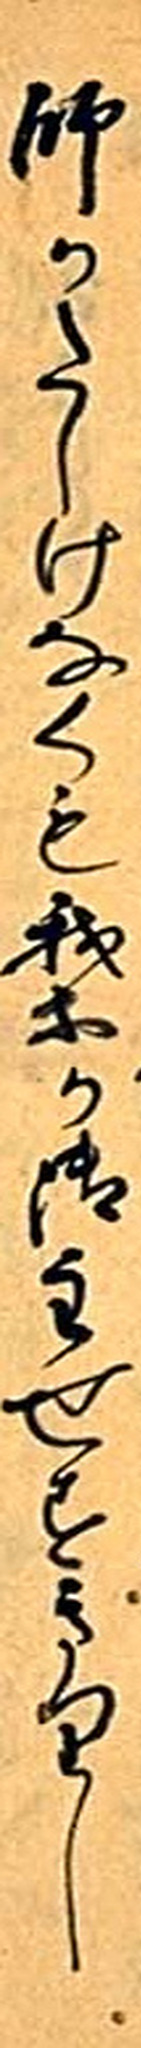師かたしけなくも我等か御主せすきりし
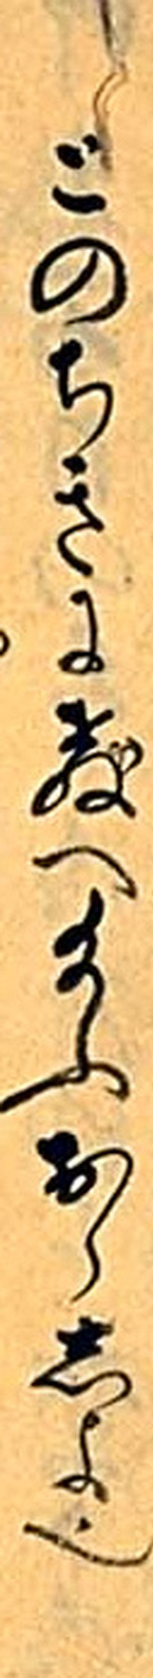とのちきに教へ給ふおらしよ也
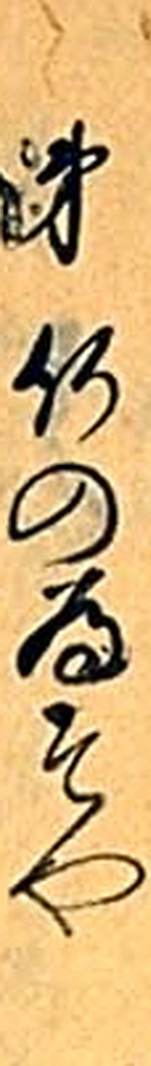弟何の為そや
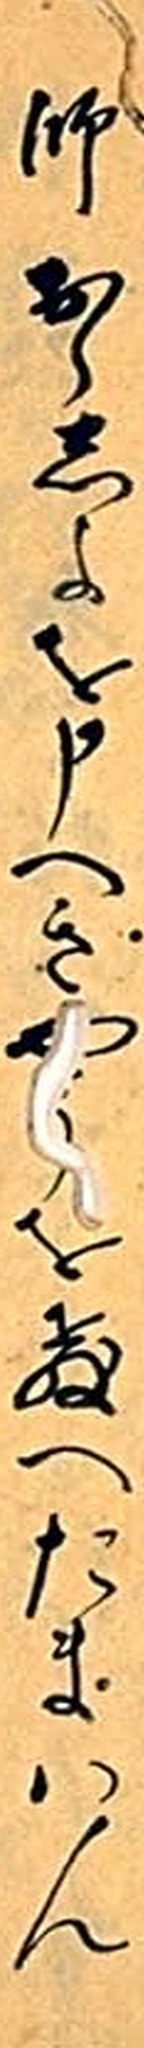師おらしよを申へきやうを教へたまはん
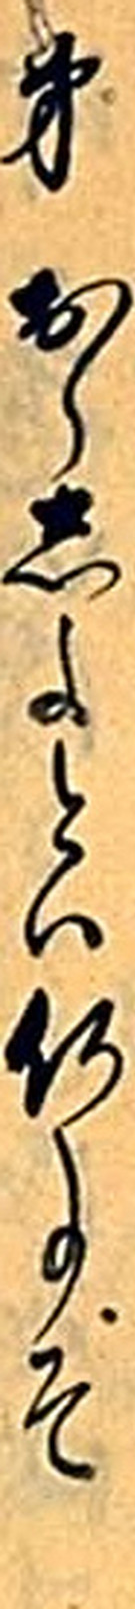弟おらしよとは何事そ
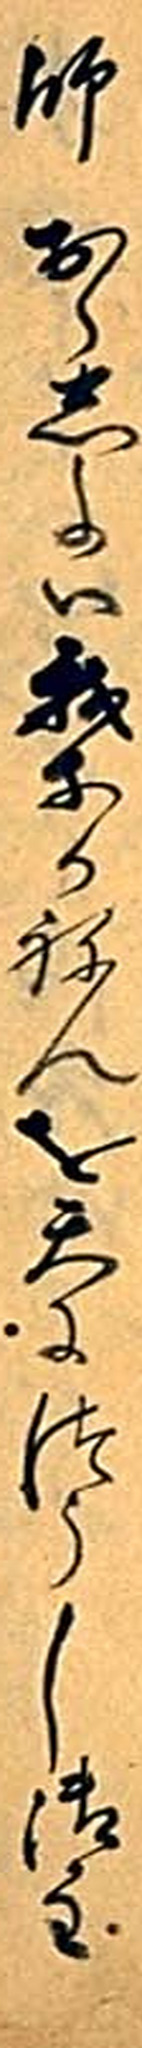師おらしよは我等かねんを天につうし御主
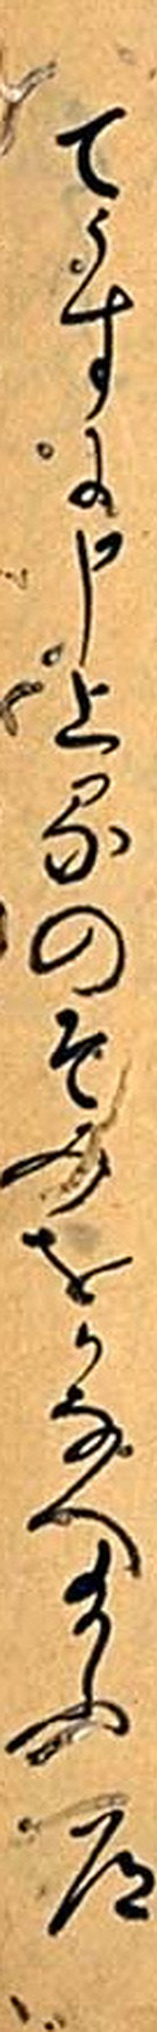てうすに申上るのそみをかなへ給ふ道

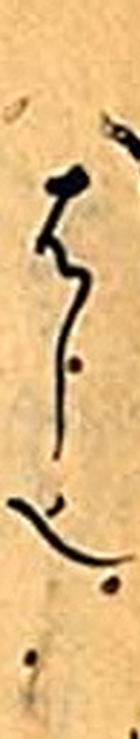はし也
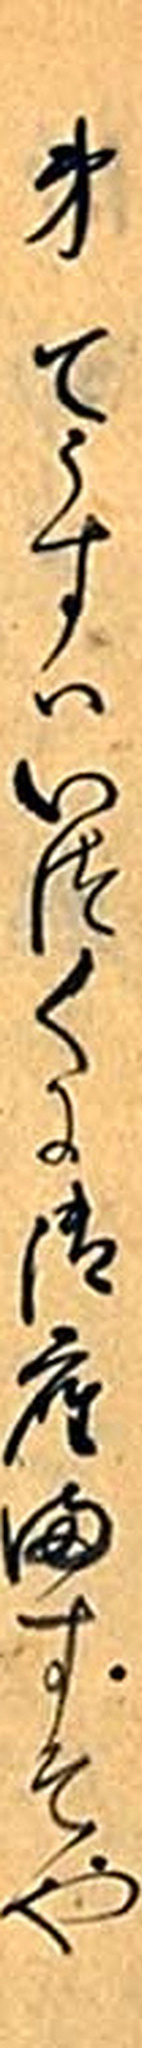弟てうすはいつくに御座ますそや
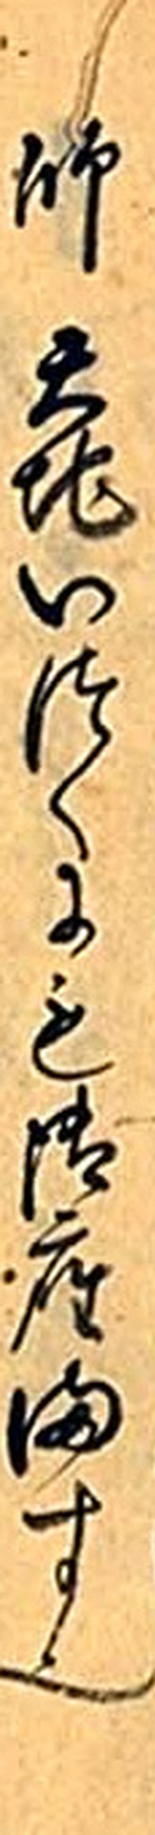師天地いつくにも御座ます也
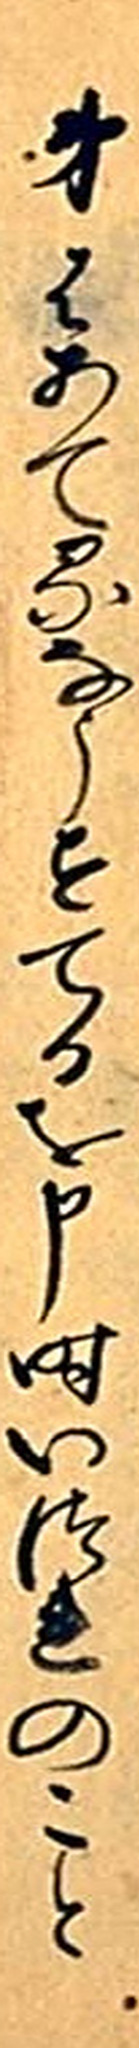弟はあてるなうすてるを申時いつれのこと
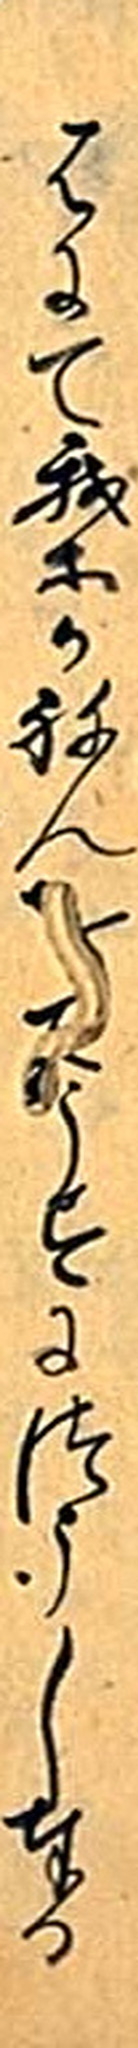はにて我等かねんをてうすにつうし奉る
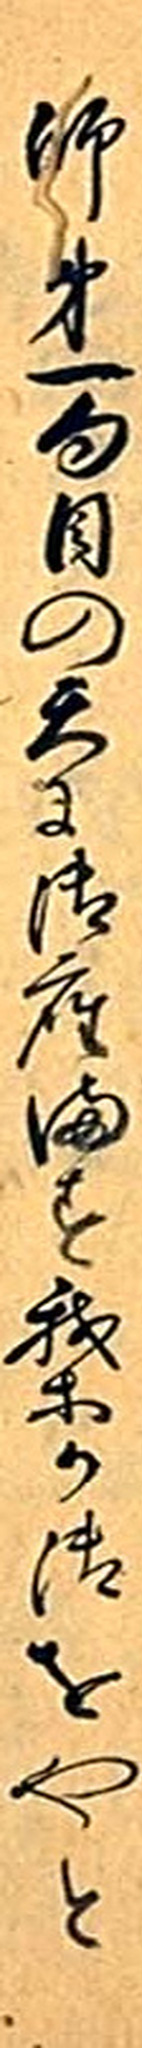師第一句目の天に御座ます我等か御をやと
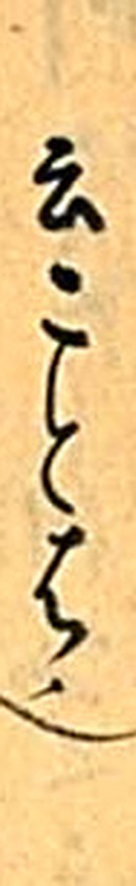云ことは也
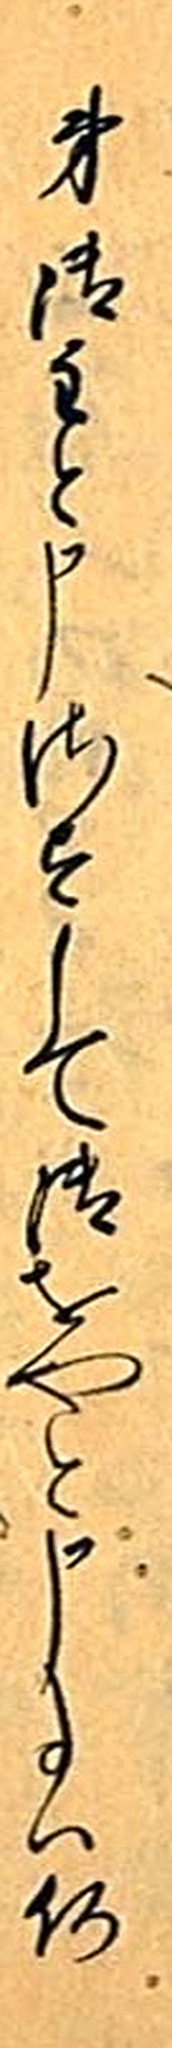弟御主と申さすして御をやと申事は何
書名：ドチリナ・キリシタン
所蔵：東京大学総合図書館 / General Library in the University of Tokyo
